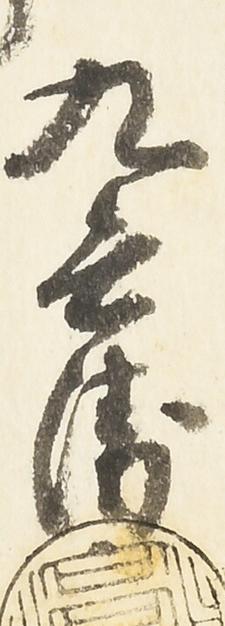九兵衛
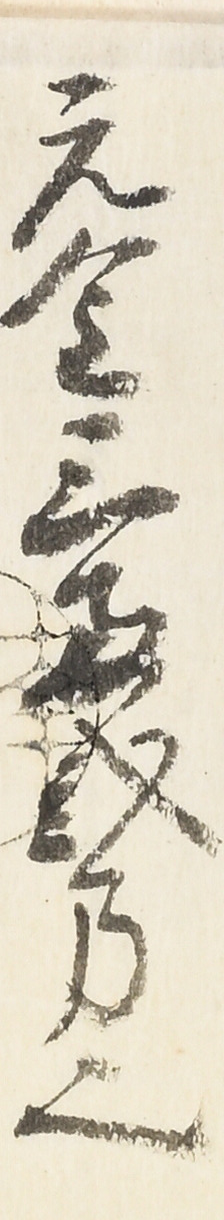元金三両弐分也
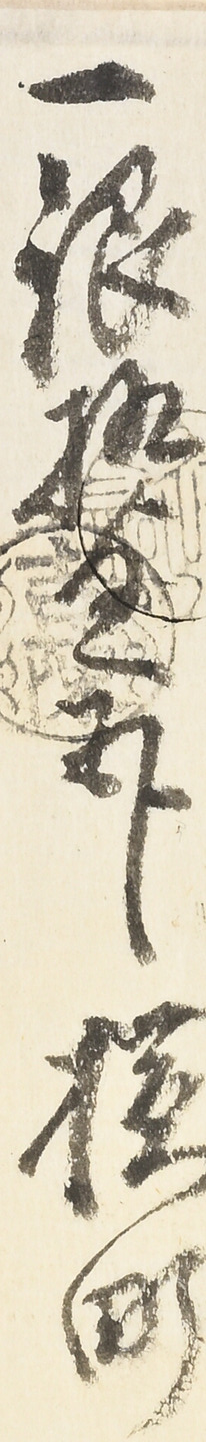一銀拾匁五分横町
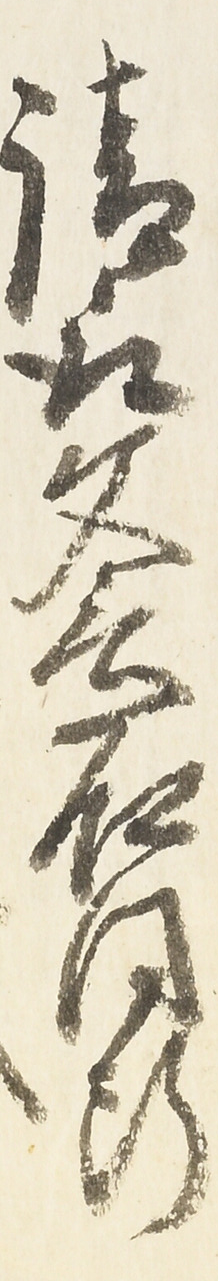請取文言右同断
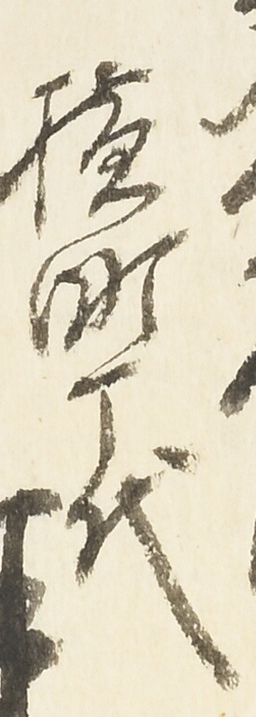横町丁代
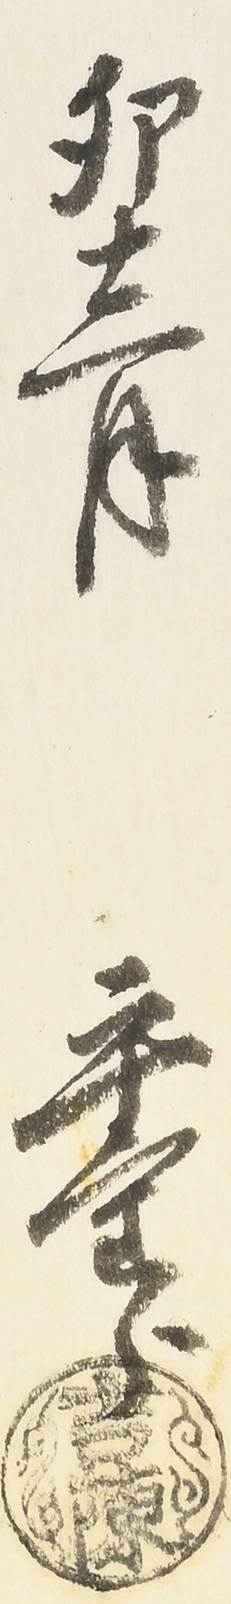卯十二月平重郎
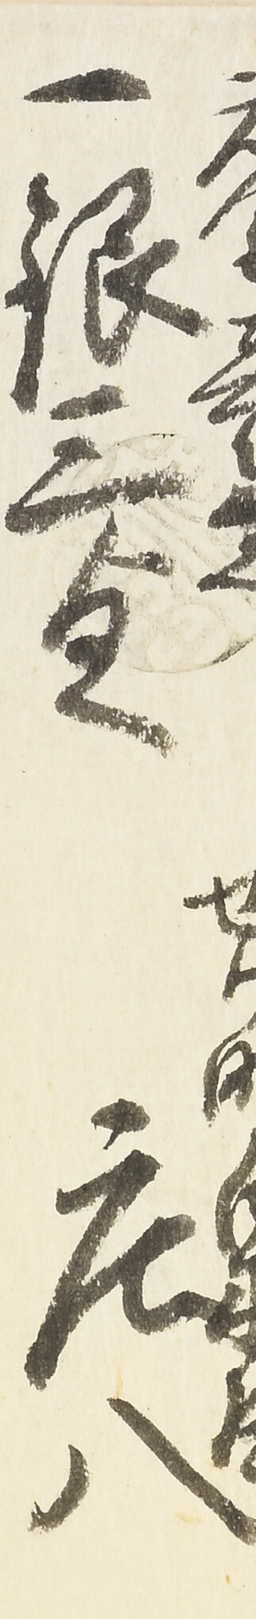一銀三匁庄八
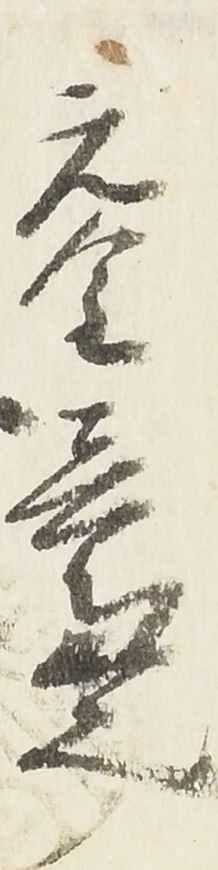元金壱両也
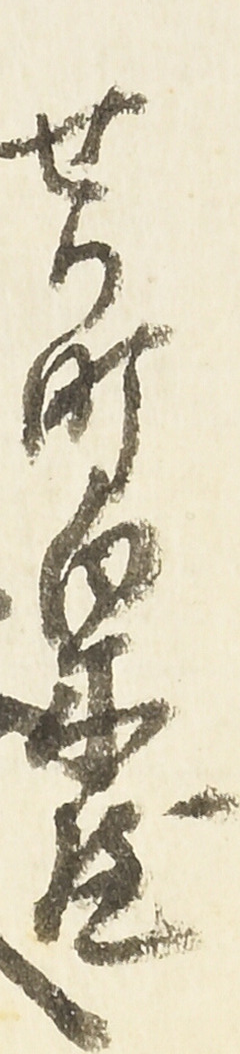せり町白木屋
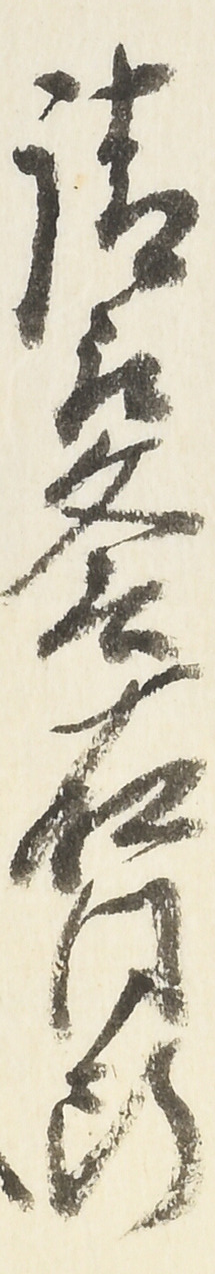請取文言右同断
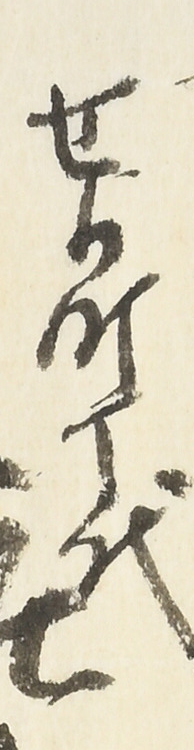せり町丁代
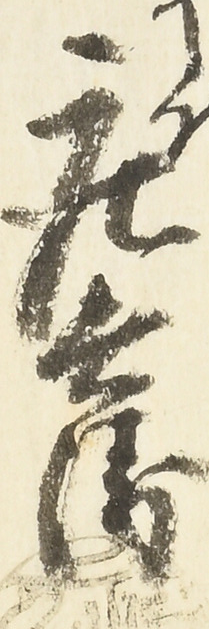庄兵衛
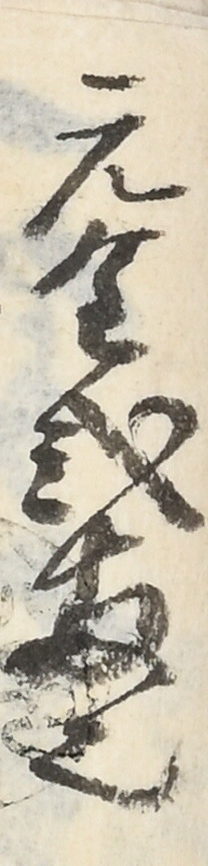元金壱両也
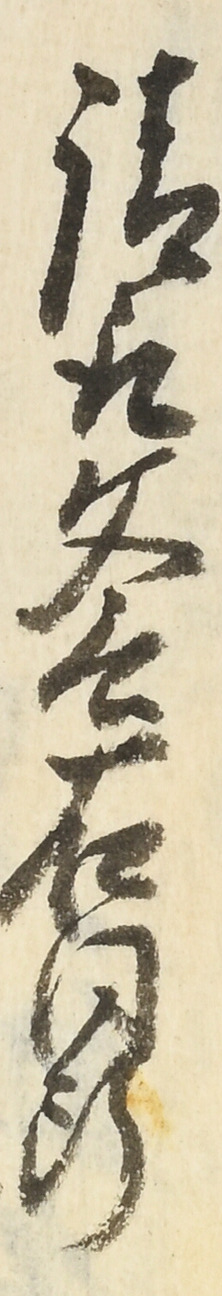請取文言右同断

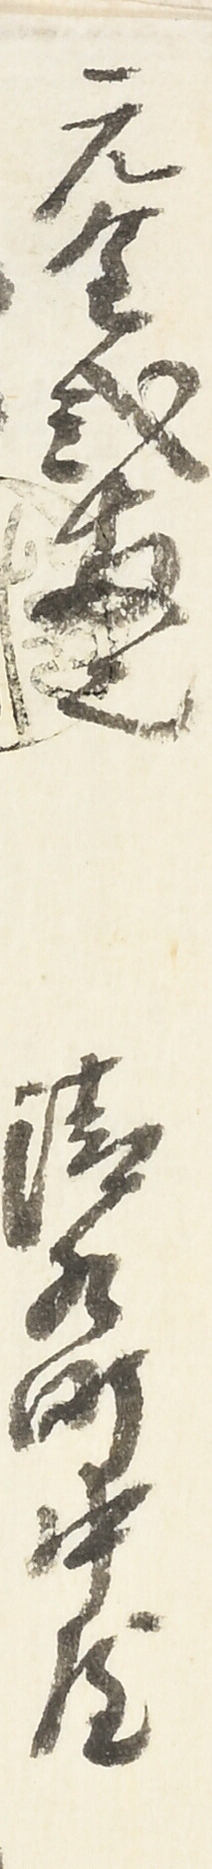元金弐両也清水町中屋
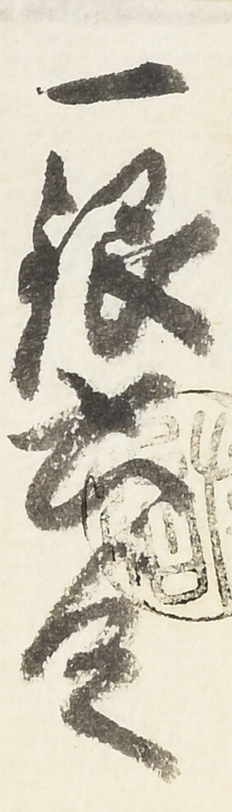一銀六匁
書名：御才覚金御利足割渡扣帳
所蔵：伊那市立高遠町図書館・合同会社AMANE
